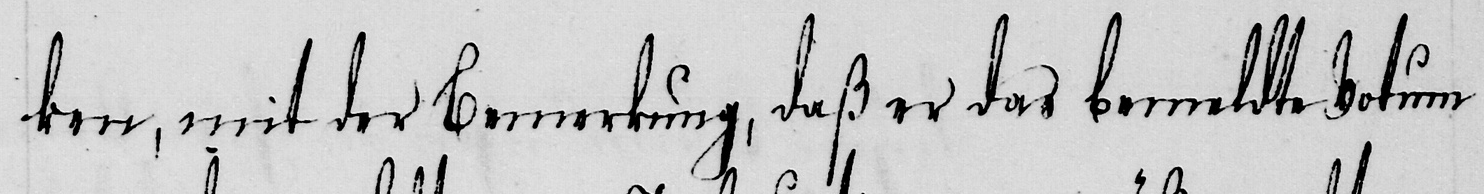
ken, mit der Bemerkung, daß er das bemeldte Votum
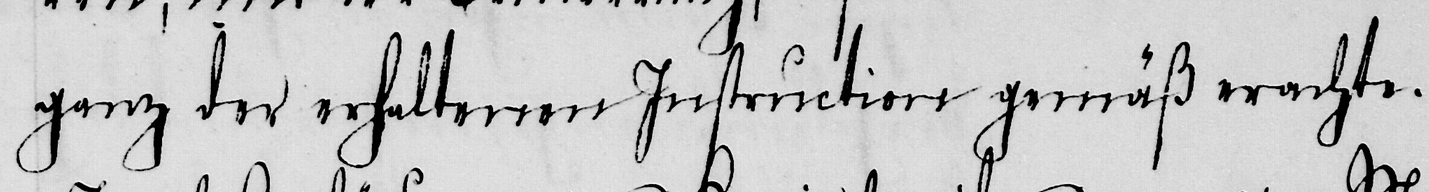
ganz der erhaltenen Instruction gemäß erachte.
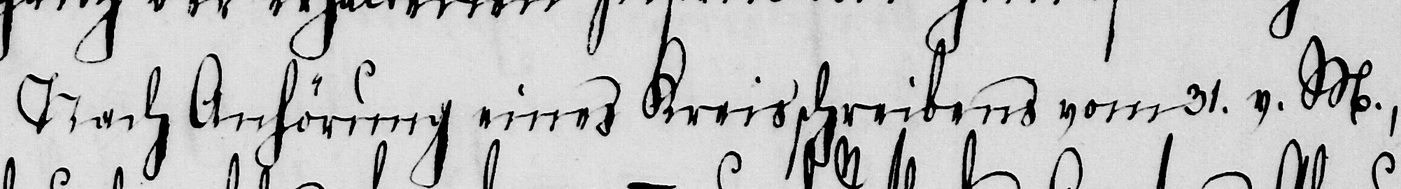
Nach Anhörung eines Kreisschreibens vom 31. v. M.,
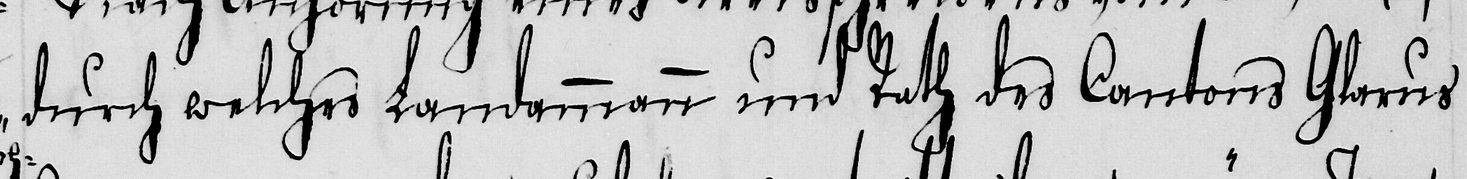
durch welches Landammann und Regierung des Cantons
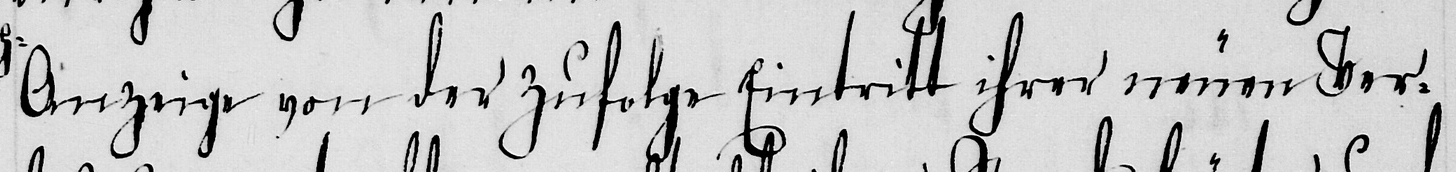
Anzeige von der Zufolge Eintritt ihrer neuen Ver¬
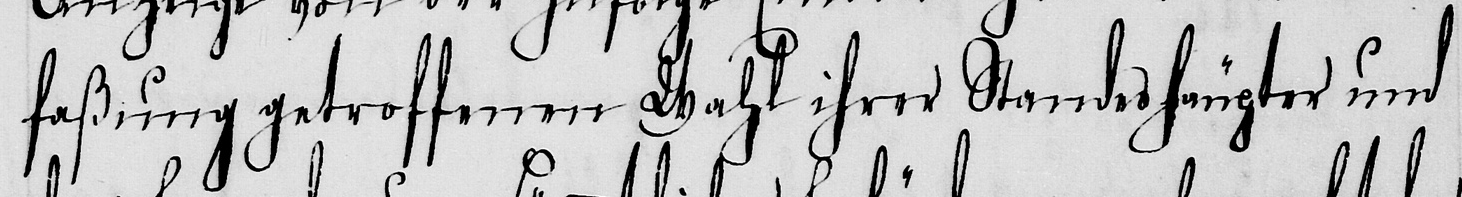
faßung getroffenen Wahl ihrer Standeshäupter und
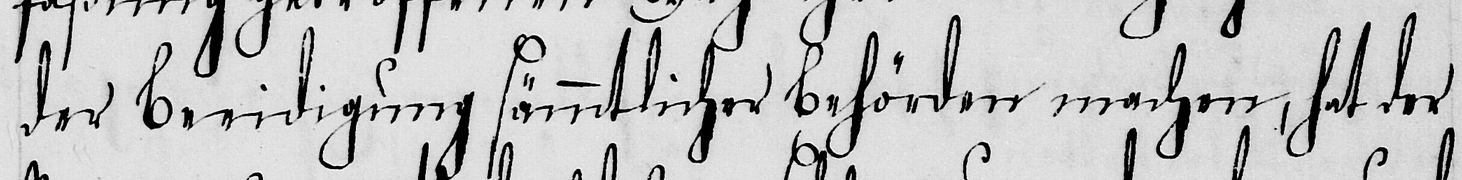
der Beeidigung sämmtlicher Behörden machen, hat der
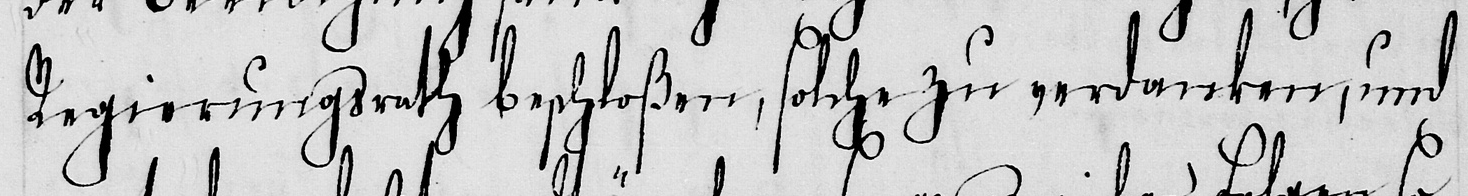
Regierungsrath beschloßen, solche zu verdanken, und
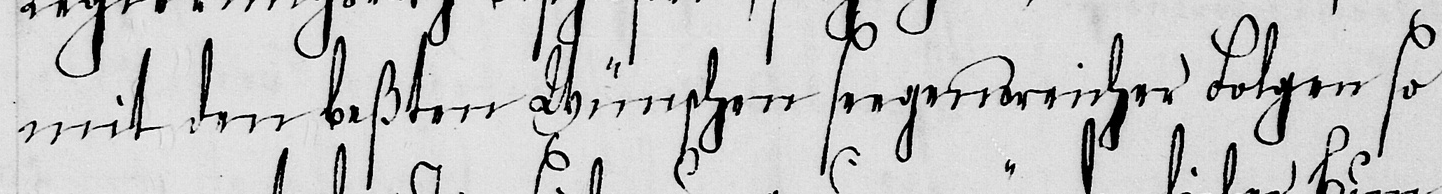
mit den beßten Wünschen seegensreicher Folgen so
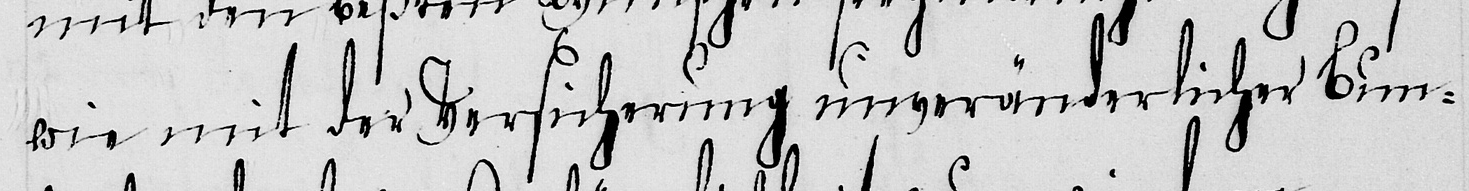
wie mit der Versicherung unveränderlicher Bun¬
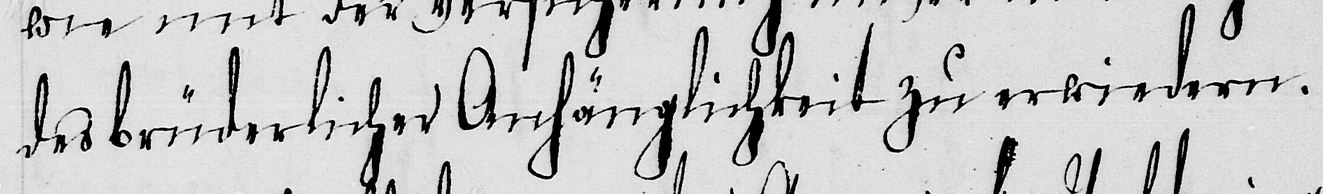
desbrüderlicher Anhänglichkeit zu erwiedern.
